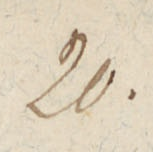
20.
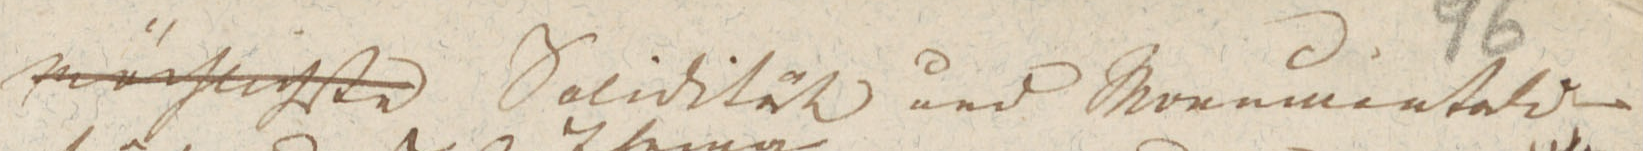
möglichste Solidität und Monumentali-
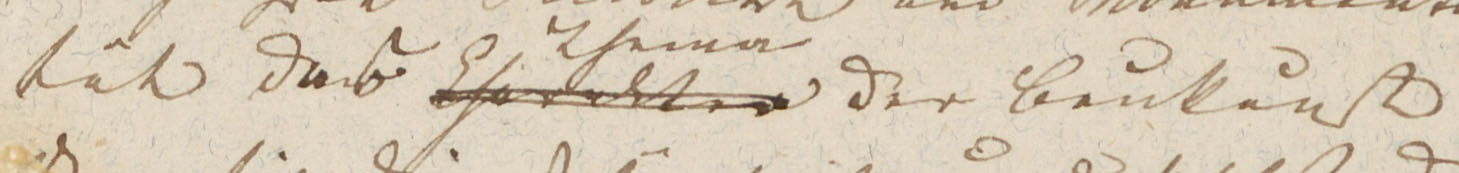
tät deras Charakter Thema der Baukunst,
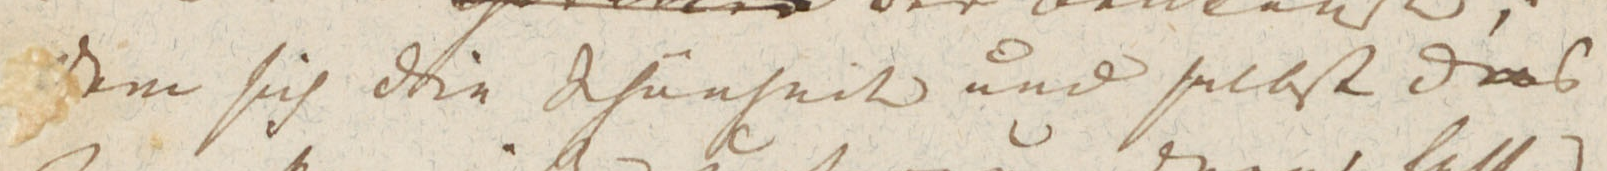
dem sich die Schönheit und selbst das
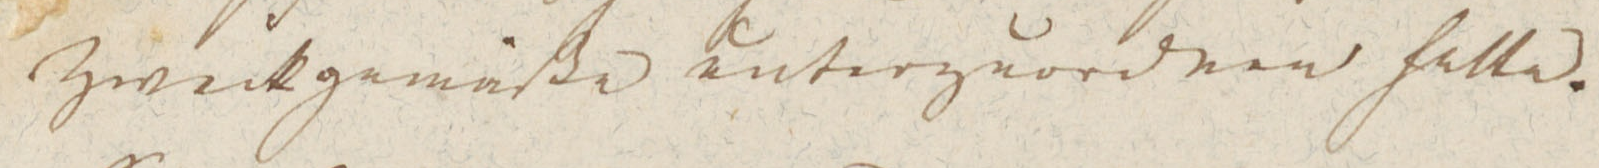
Zweckgemässe unterzuordnen hatte.
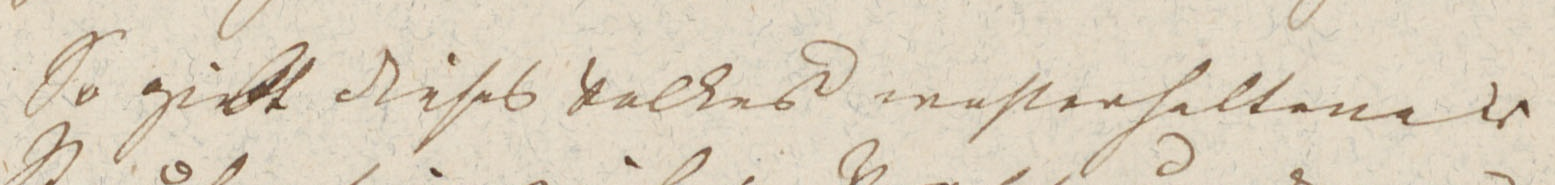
So gibt dieses Volkes wohlerhaltener
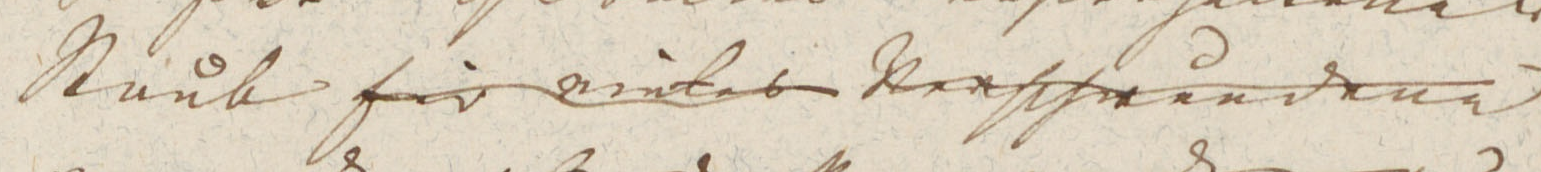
Staub für vieles Verschwundene
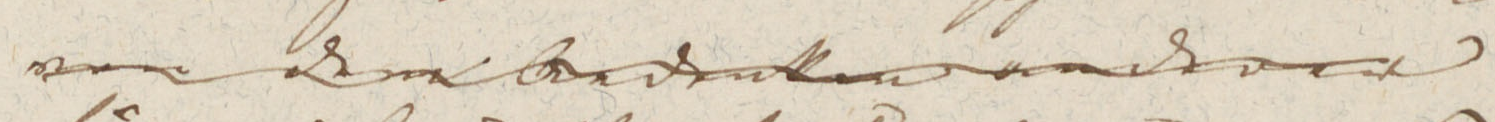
von dem Andenken anderer
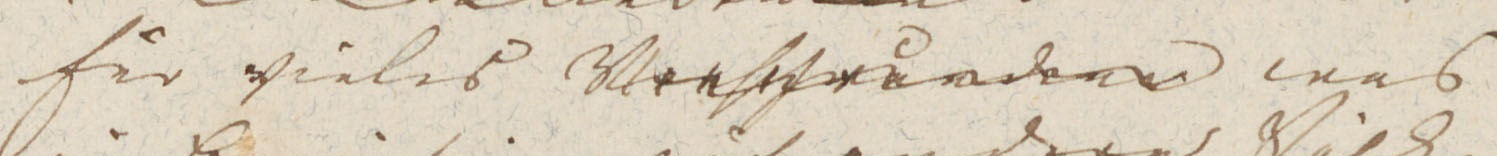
für vieles Verschwundene was
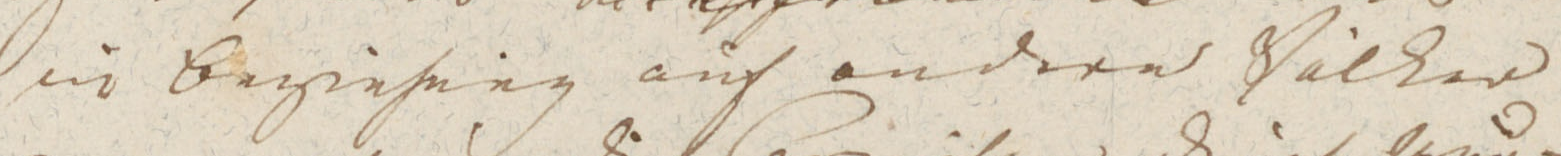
in Beziehung auf andere Völker
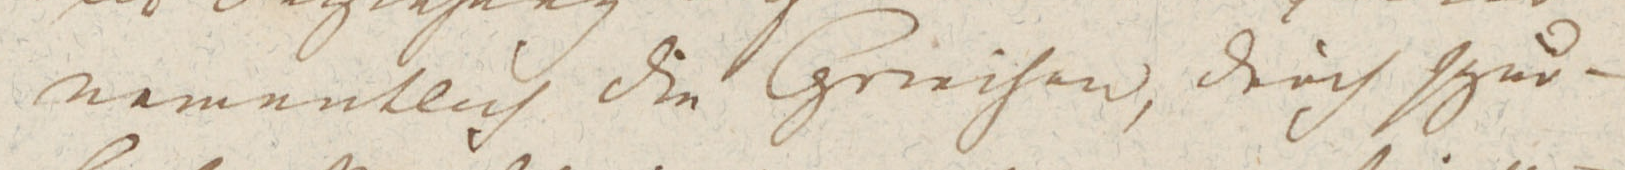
namentlich die Griechen, durch spur-
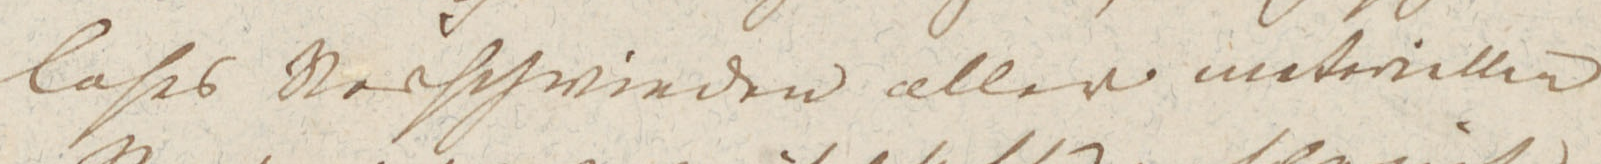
loses Verschwinden aller materiellen
